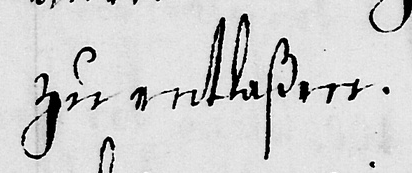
zu entlaßen.
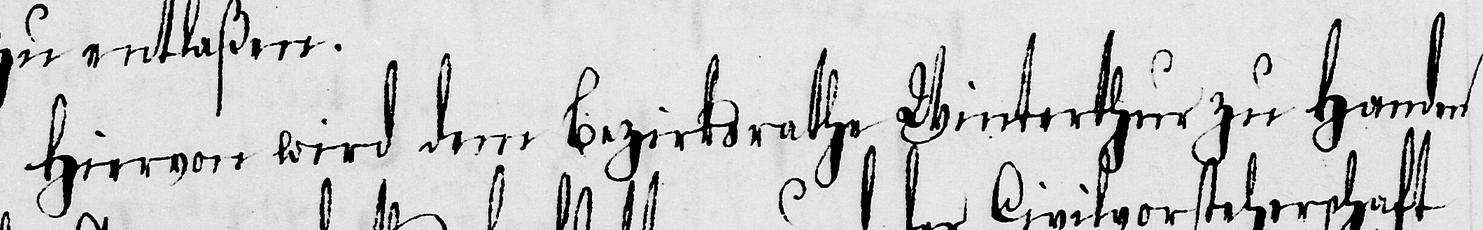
Hiervon wird dem Bezirksrathe Winterthur zu Handen
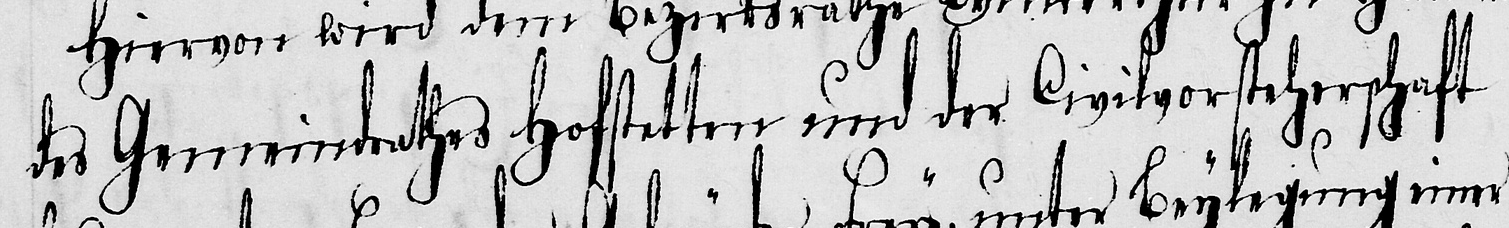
des Gemeindrathes Hofstetten und der Civilvorsteherschaft
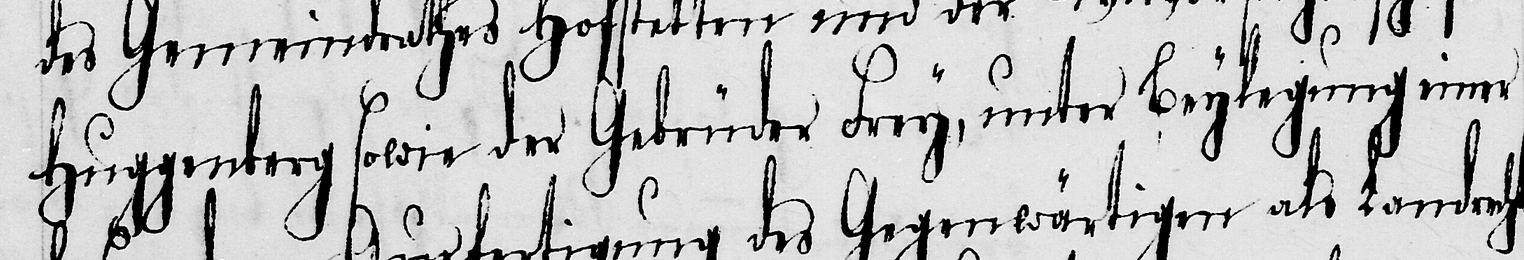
Huggenberg sowie der Gebrüder Frey, unter Beylegung einer
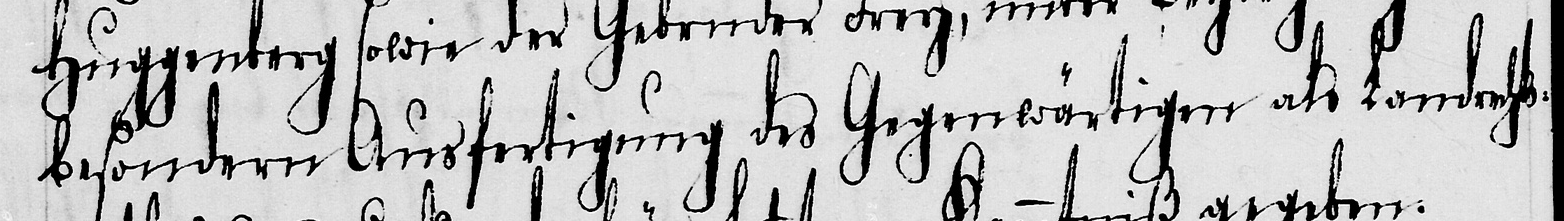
besondern Ausfertigung des Gegenwärtigen als Landrech¬
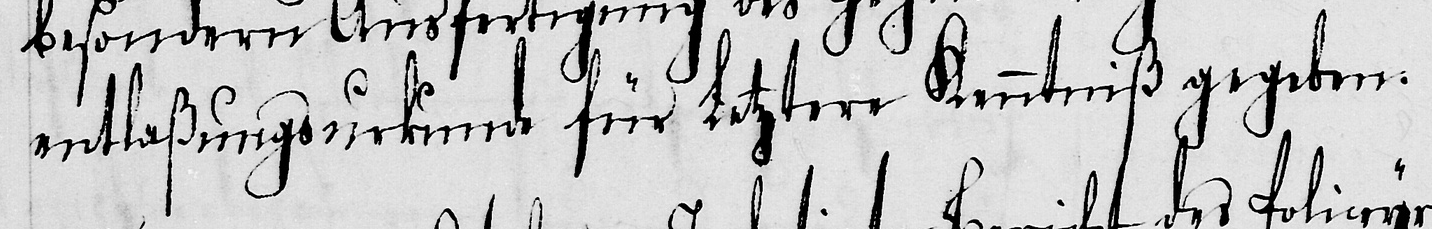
entlaßungsurkunde für Letztere Kenntniß gegeben.
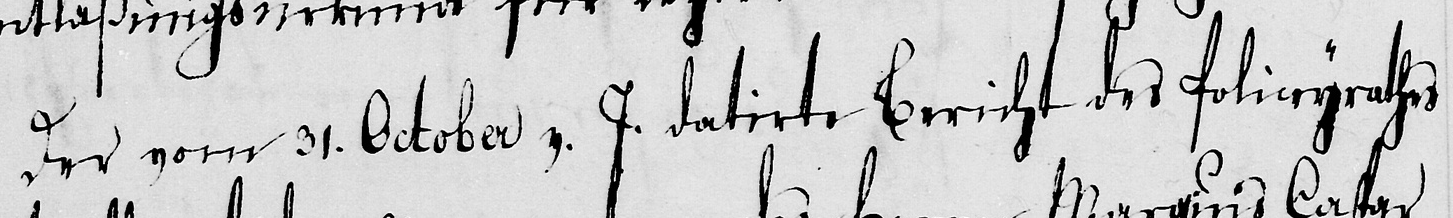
Der vom 31. October v. J. datirte Bericht des Policeyrathes
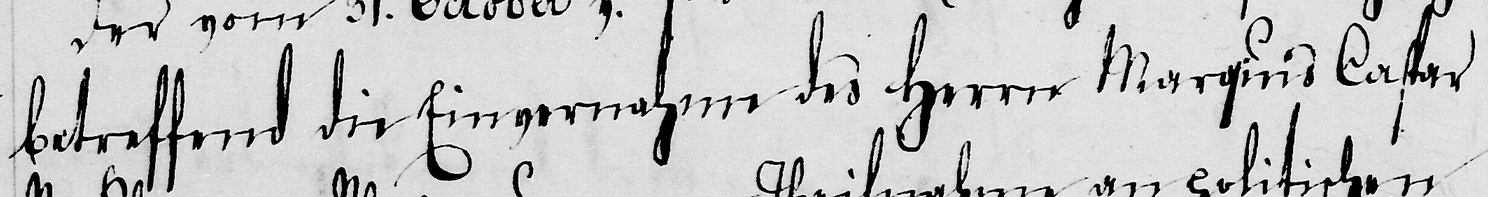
betreffend die Einvernahme des Herrn Marquis Caspar
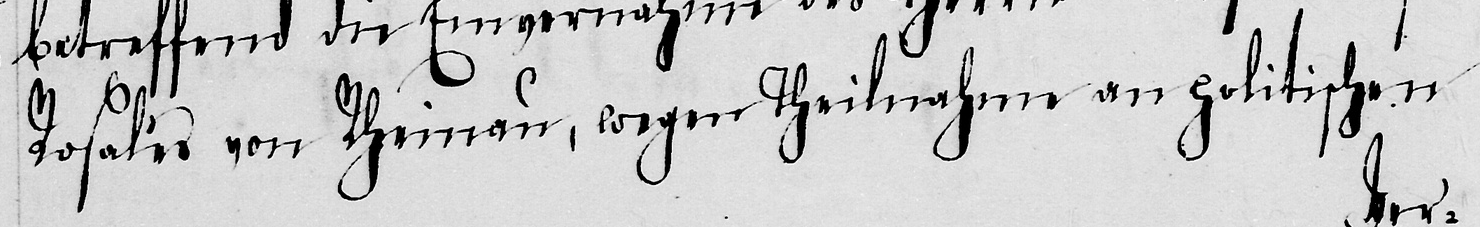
Rosales von Rheinau, wegen Theilnahme an politischen
